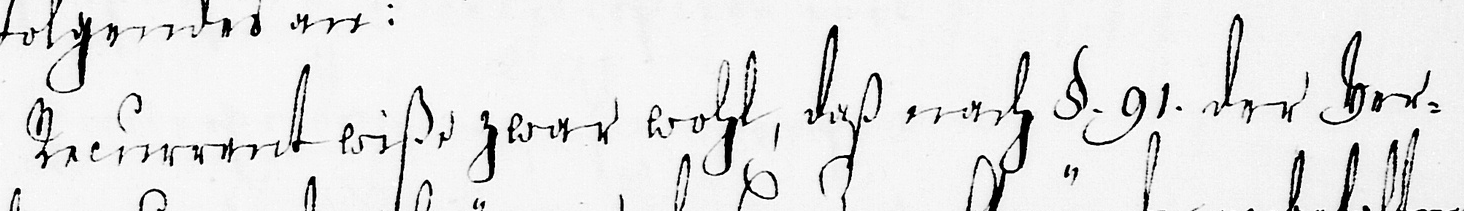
Recurrent wiße zwar wohl, daß nach §. 91. der Ver¬
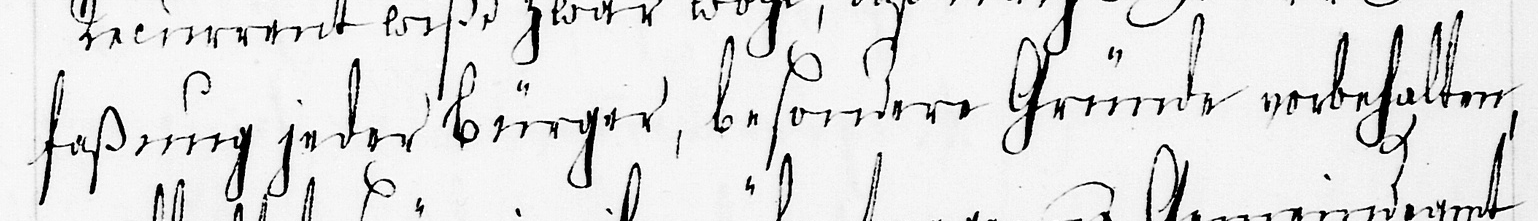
faßung jeder Bürger, besondere Gründe vorbehalten,
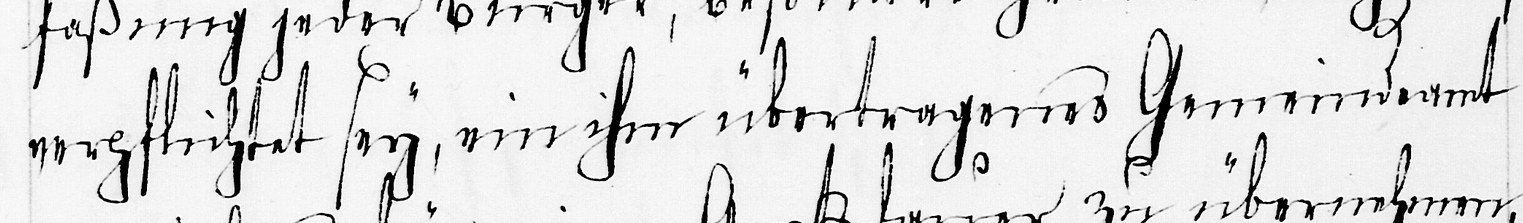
verpflichtet sey, ein ihm übertragenes Gemeindeamt
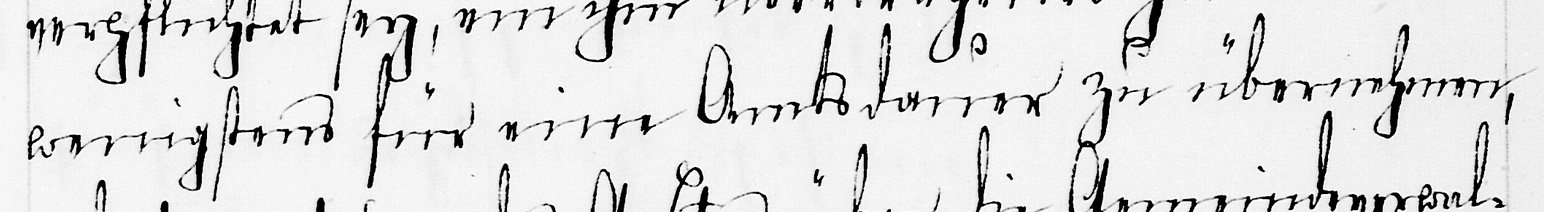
wenigstens für eine Amtsdauer zu übernehmen,
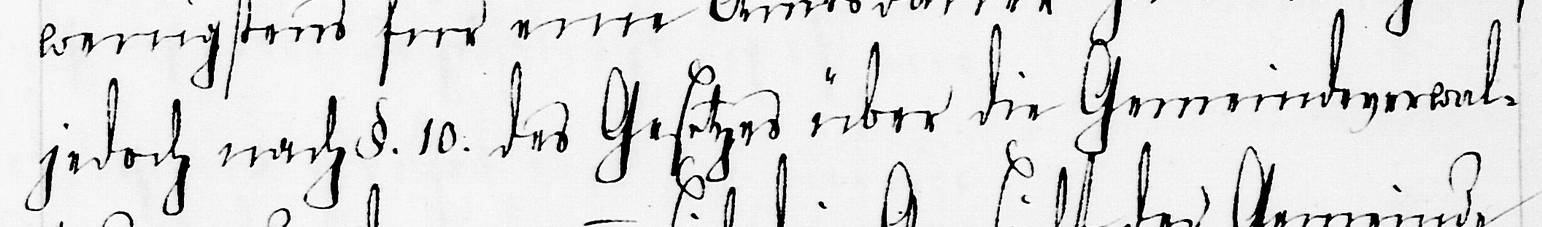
jedoch nach §. 10. des Gesetzes über die Gemeindeverwal¬
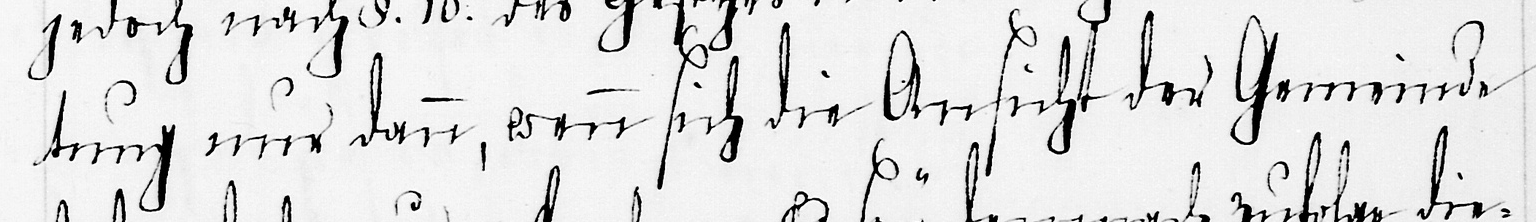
tung nur dann, wenn sich die Ansicht der Gemeinde
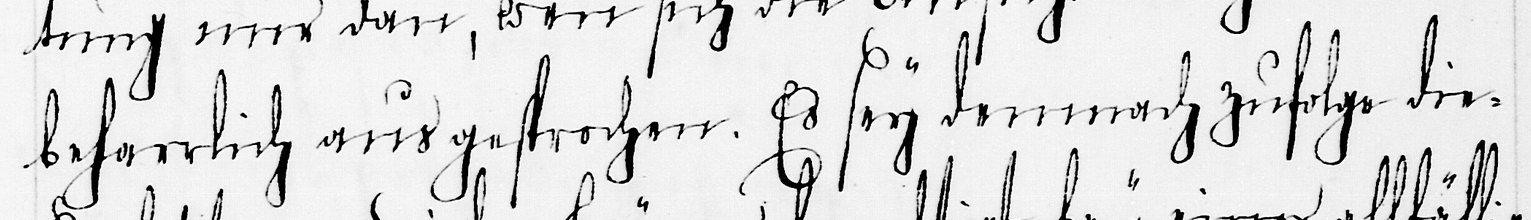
beharrlich ausgesprochen. Es sey demnach zufolge die¬
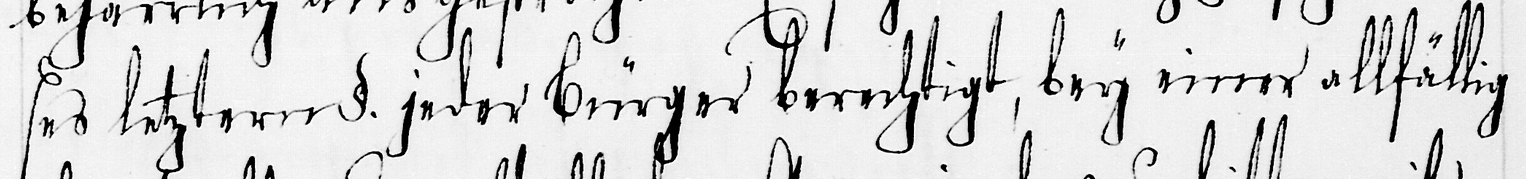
ses letztern §. jeder Bürger berechtigt, bey einer allfällig
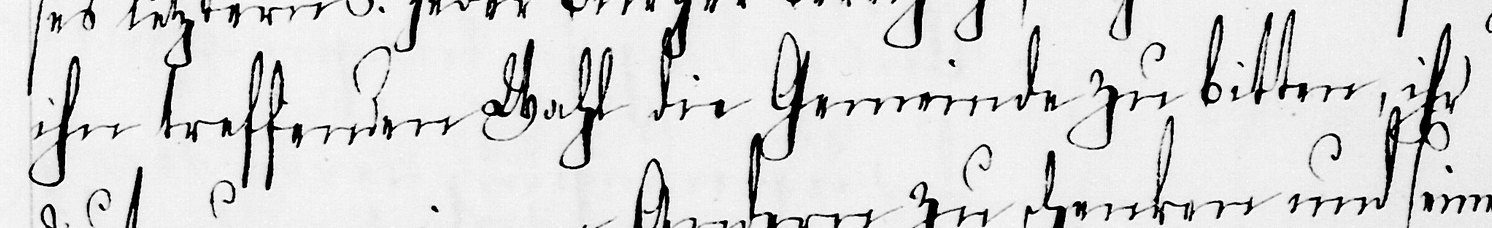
ihn treffenden Wahl die Gemeinde zu bitten, ihr
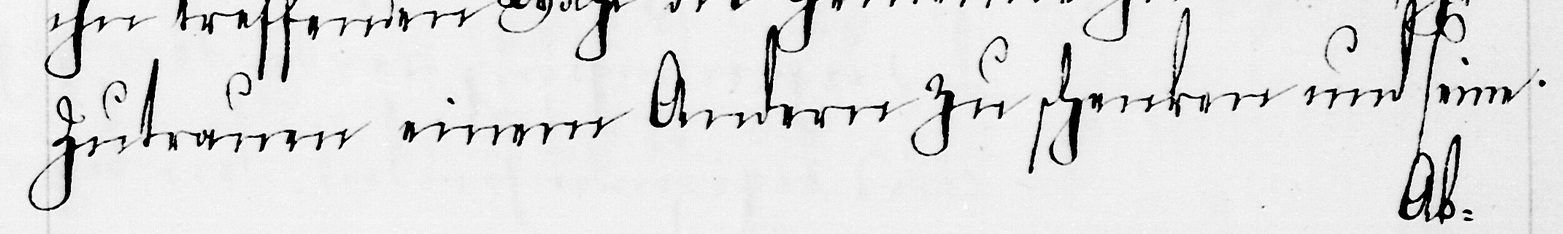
Zutrauen einem Andern zu schenken und seine
